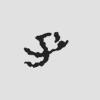子
